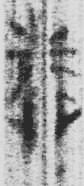眚（性）
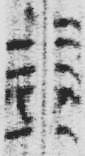者
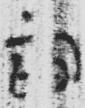古（故）
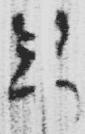也
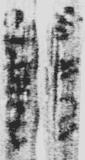○（厲）
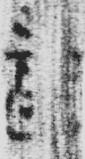眚（性）
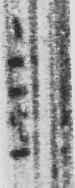者
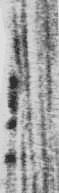宜（義）
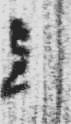也
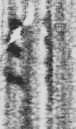出
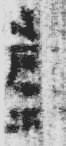眚（性）
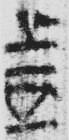者
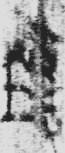埶（势）
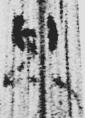也
